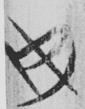𡚦（焉）
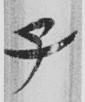子
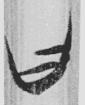曰
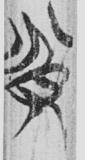貧
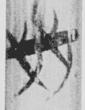戔（賤）
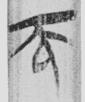而
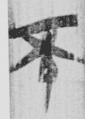不
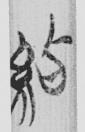約
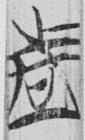者
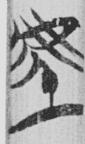○（吾）
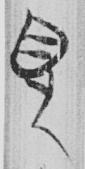見
